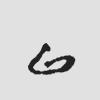㠯（以）
